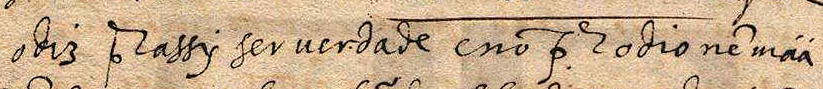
o diz por assy ser uerdade e nō por odio nē maa
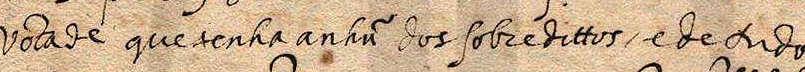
vōtade que tenha a nhū dos sobredittos, e de tudo
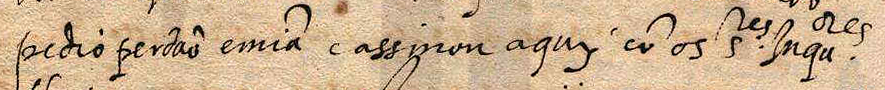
pedio perdaõ e miā e assinou aquy cō os sres. Jnquores.
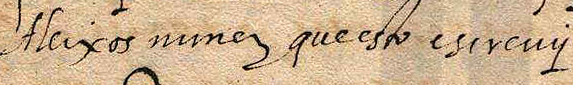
Aleixos nunez que esto escreuy
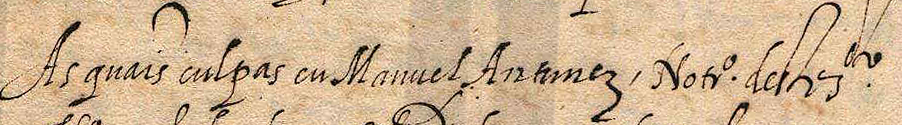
As quais culpas eu Manuel Antunez, Notro. deste scto.
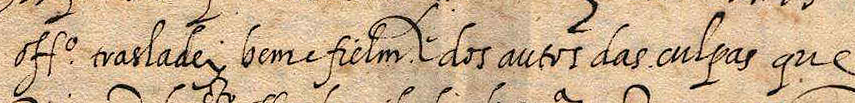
offo. trasladey bem e fielm.te dos autos das culpas que
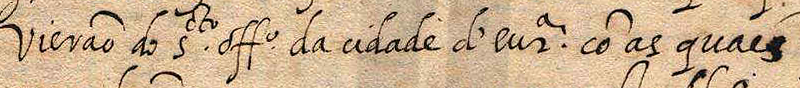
Vierão do scto. offo. da cidade d'eura. cō as quaes̄
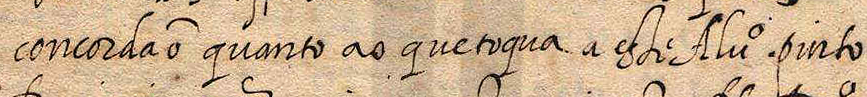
concordaõ quanto ao que toqua a este Aluo. pinto
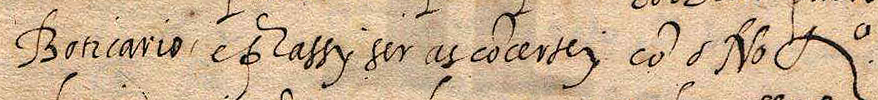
Boticario, e por assy ser as cōcertey cō o Notro.
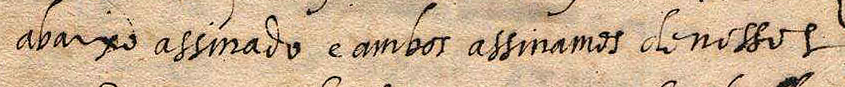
abaixo assinado e ambos assinamos de nossos
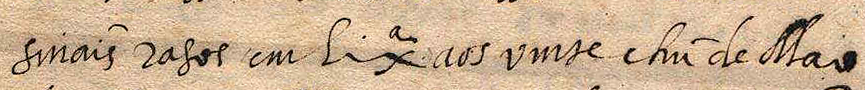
sinais rasos, em Lixa. aos vinte e hū de Maio
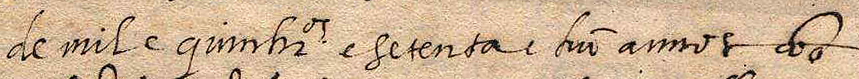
de mil e quinhtos. e setenta e hū annos cō o
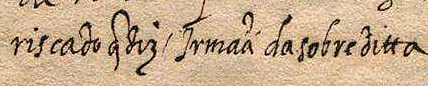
riscado q̄ diz, Jrmaã da sobreditta
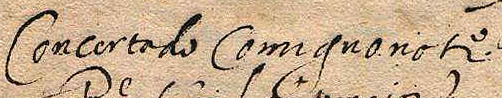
Concertado Comiguo notro.
